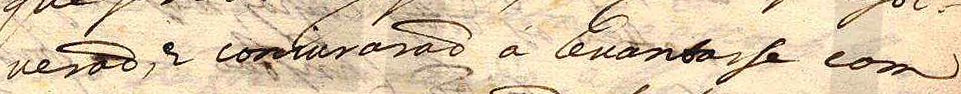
uerão, E coniurarão a leuantarse com
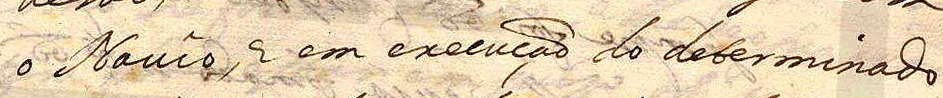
o Nauio, E em execução do determinado
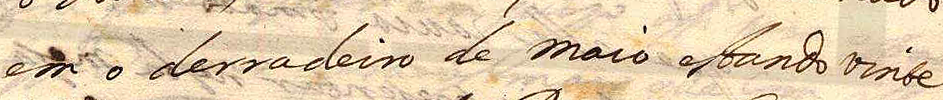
em o derradeiro de maio estando vinte
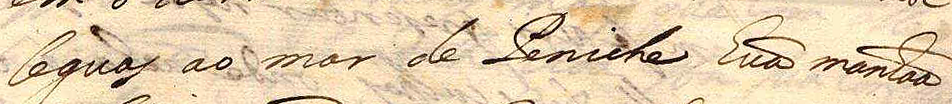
leguas ao mar de Peniche hua manhaā
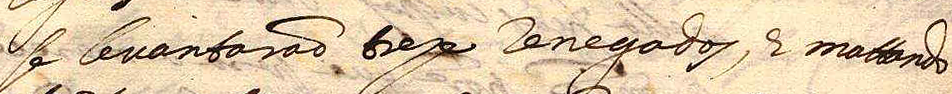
se leuantarão treze Renegados, E mattando
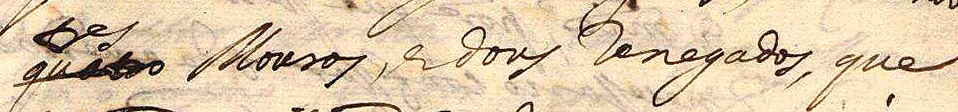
quatro Mouros, E dous Renegados, que
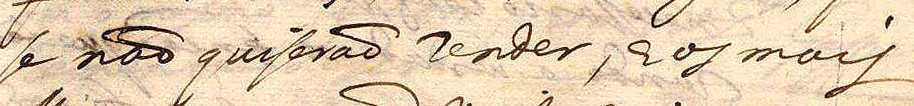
se não quiserão render, E os mais
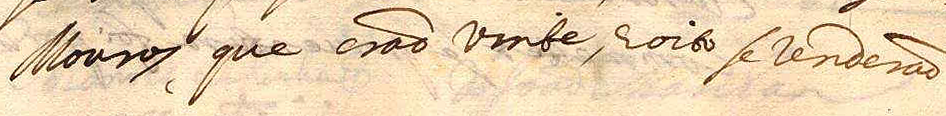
Mouros que erão vinte, e oito se renderão
